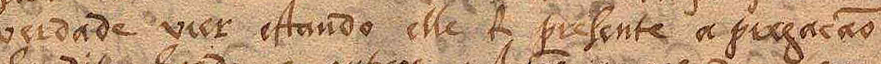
verdade vier estando elle R presente a pregacaõ
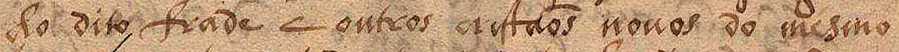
do dito frade e outros cristaõs nouos do mesmo
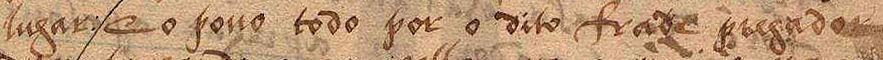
lugar e o pouo todo por o dito frade pregador
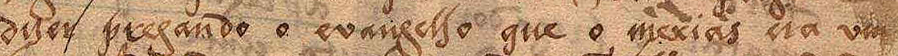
dizer pregando o evangelho que o mexias era vin
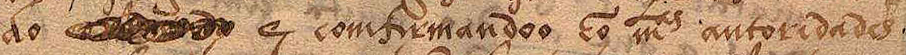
do _ e comfermandoo cō mtas autoridades.
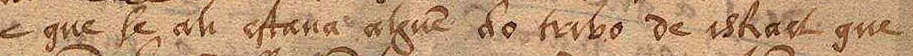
e que se ali Estaua alguē do tribo de isRael que
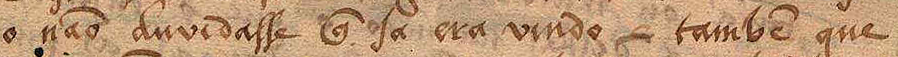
o não duvidasse q̄ Ja era vindo e tambē que
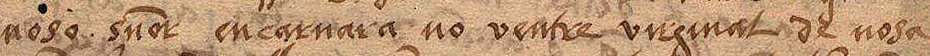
noso sn̄or encarnara no ventre virginaL de nosa
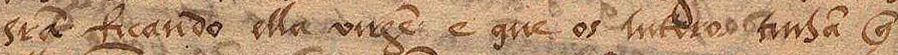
srā ficando ella virgē e que os luteros tinhā q̄
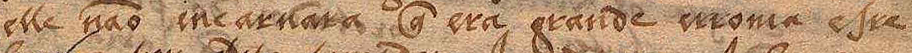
elle não encarnara q̄ era grande erronia e Jre
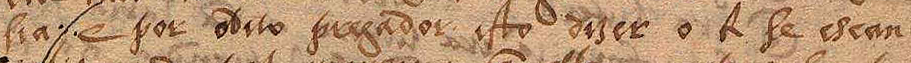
sia ./. E por o dito pregador isto dizer o R se escan
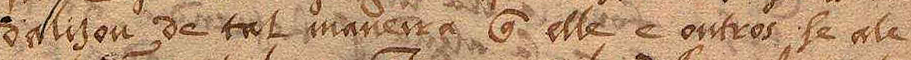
dalizou de tal maneira q̄ elle e outros se ale
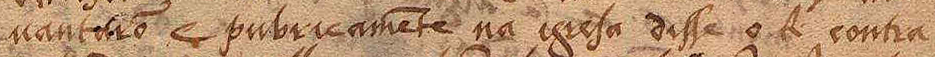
uantarō e pubricamēte na igreJa disse o R contra
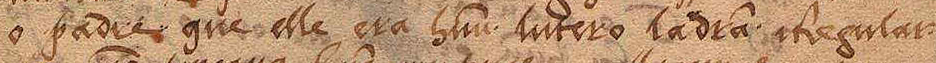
o padre que elle era huū lutero ladrā. iRegular
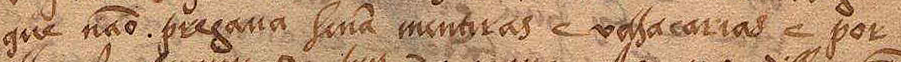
que não pregaua senā mentiras e velhacarias e por
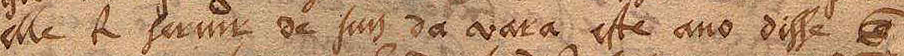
elle R seruir de Juis da vara este ano disse _
